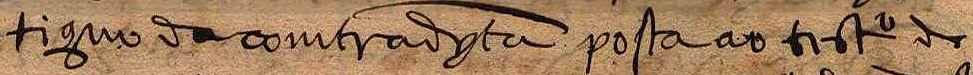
tiguo da comtradyta posta ao testo de
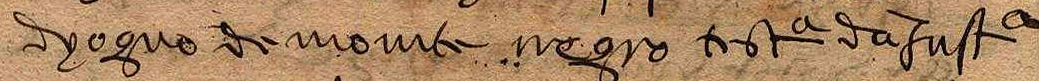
dyoguo de momtenegro testa da Justa
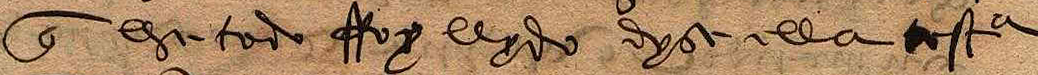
q̄ lhe todo ffoy llydo dyse ella testa
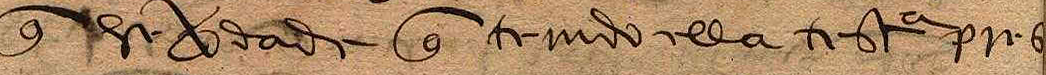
q̄ he ꝟdade q̄ temdo ella testa pres
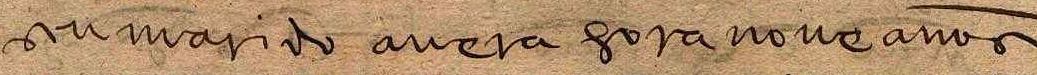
seu marido auera hora noue anos
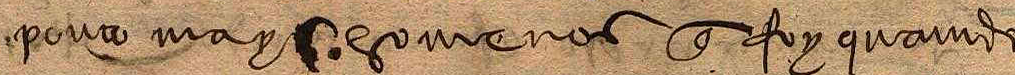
pouco mays ho menos q̄ foy quamdo
